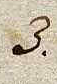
3.
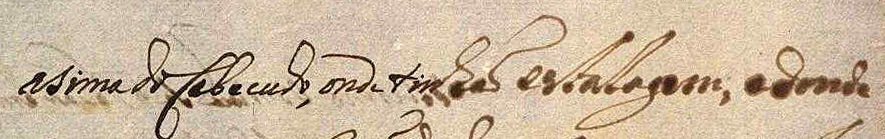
asima do Cabecudo, onde tinhaõ estalagem, e donde
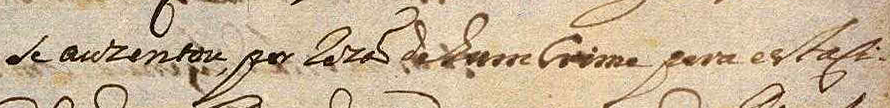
se auzentou, por Rezaõ de hum Crime para esta Ci
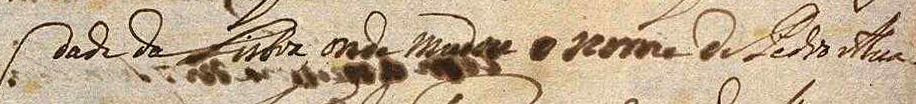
dade da Lisboa, onde mudou o nome de Pedro Alua
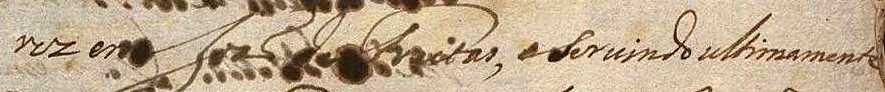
rez em Joaõ de Freitas, e seruindo ultimamente
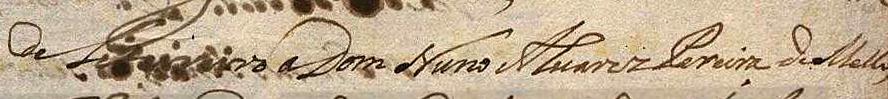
de Liteireiro a Dom Nuno Aluarez Pereira de Mello
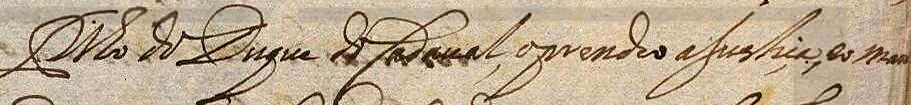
filho do Duque do Cadaual, o prendeo a Justiça, e o man
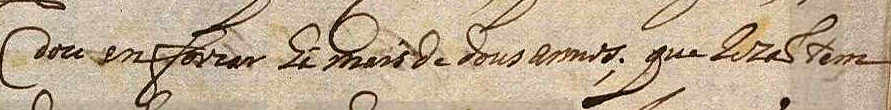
dou enforcar há mais de dous annos; que Rezaõ tem
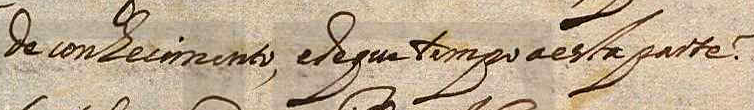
de conhecimento, e de que tempo a esta parte?
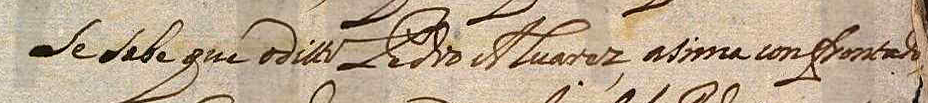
se sabe que o ditto Pedro Aluarez asima confrontado
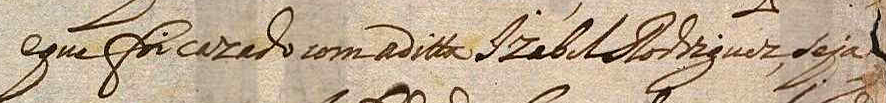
e que foi cazado com a ditta Izabel Rodriguez, seja
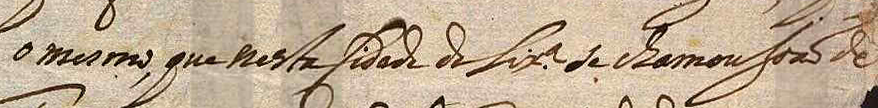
o mesmo, que nesta Cidade de Lix.a se chamou Joaõ de
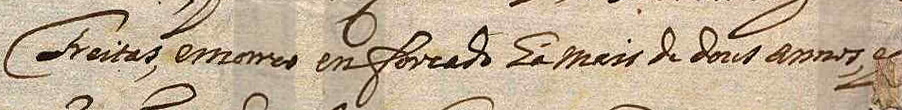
Freitas, e morreo enforcado ha mais de dous annos, e
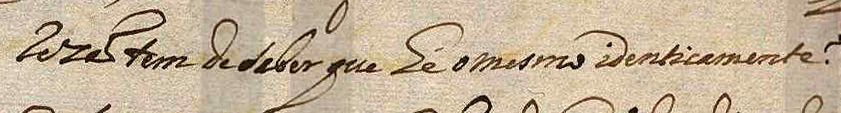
Rezão tem de saber que he o mesmo identicamente?
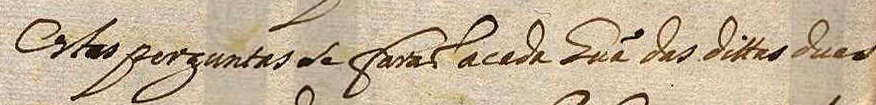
Estas perguntas se faraõ a cada huā das dittas duas
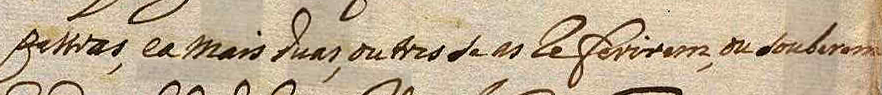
pessoas, e a mais duas ou tres se as Referirem, ou souberem
